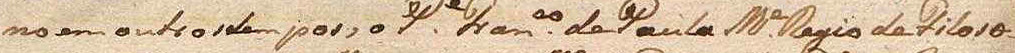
no em outros tempos, o P.e Fran.co de Paula M.e Regio de Filoso
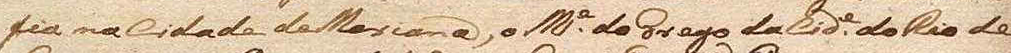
fia na Cidade de Mariana, o M.e do Grego da Cid.e do Rio de
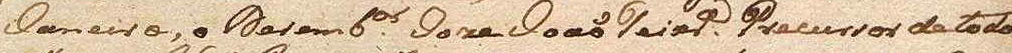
Ianeiro, o Desemb.or Ioze Ioaõ Teixr.a Precursor de todos
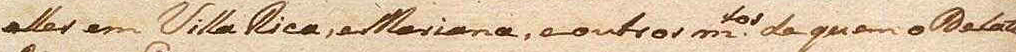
elles em Villa Rica, e Mariana, e outros m.tos de quem o Delato
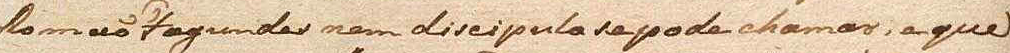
Romaõ Fagundes nem discipulo se pode chamar, e que
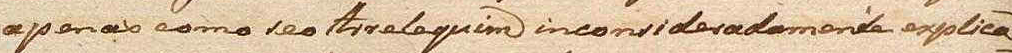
apenas como seo Arrelequim inconsideradamente explica
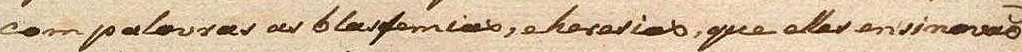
com palavras as blasfemias, e heresias, que elles ensinavaõ
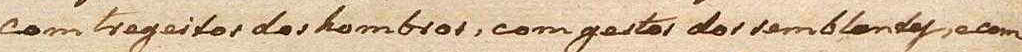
com tregeitos dos hombros, com gestos dos semblantes, e com
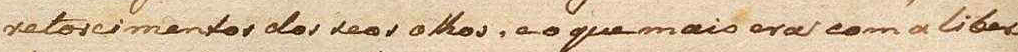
retorcimentos dos seos olhos, ao que mais era com a liber
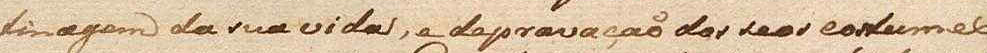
tinagem da sua vida, e depravação dos seos costumes
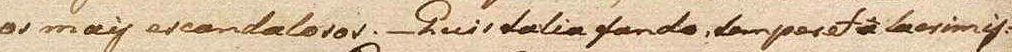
os mais escandalosos. - Quis talia fando, temperet â lacrimis?
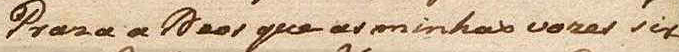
Praza a Deos que as minhas vozes sir
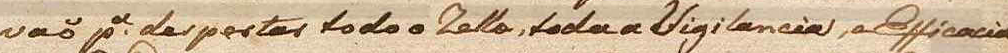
vaõ p.a despertar todo o Zello, toda a Vigilancia, e Efficacia
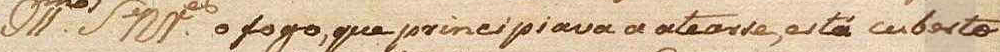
Ill.mos Snr.es o fogo, que principiava a atearse, está cuberto
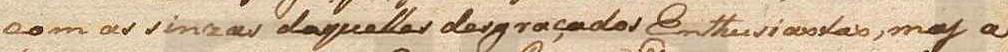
com as sinzas daquelles desgraçados Enthusiastas, mas a
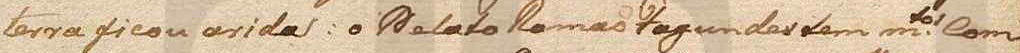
terra ficou arida: o Delato Romaõ Fagundes tem m.tos Com
